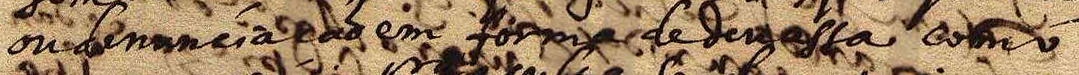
ou denunciaçaõ em forma de deuassa como
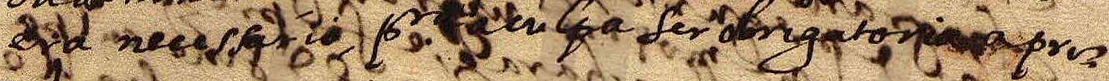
era necessario, p.ra a culpa ser obrigatoria a pri
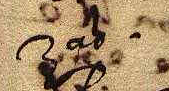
zaõ.
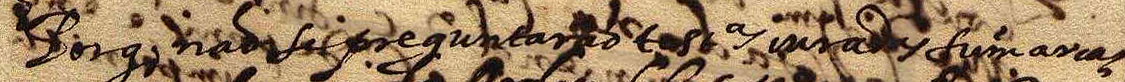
Porq. naõ se preguntaraõ testas iuradas sumaria
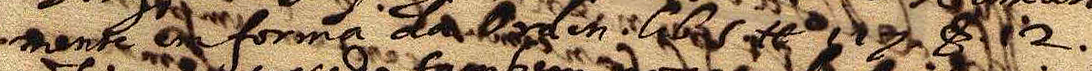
mente em forma da Orden. lib 5 tt 117 § 12.
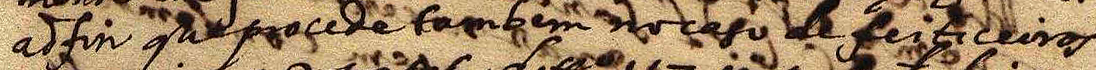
ad fin que procede tambem no caso de feiticeiros
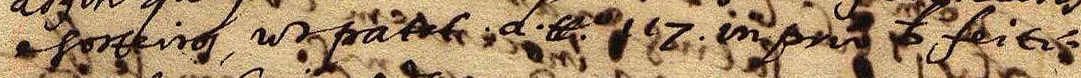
e sorteiros, ut patet. d. tt. 117. in prio b̄ feiti
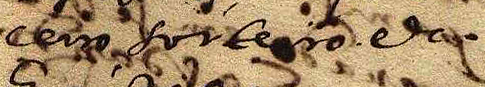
ceiro sorteiro. etc
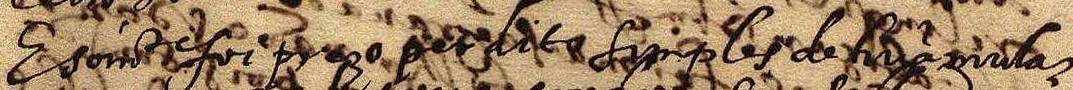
E somte foi prezo per dito simples de huā mula
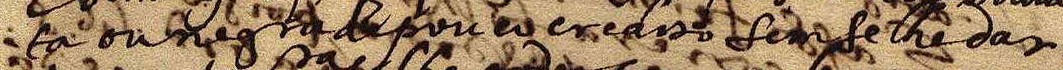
ta ou negra de pouco credito sem se lhe dar
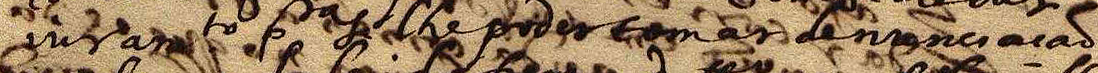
iuramto pra se lhe poder tomar denunciaçaõ
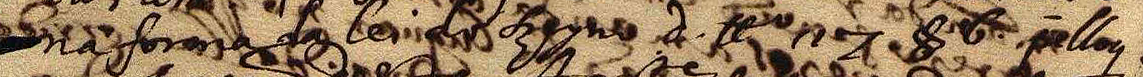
na forma da lei do Reyno d. tto 117 § 6. pello q
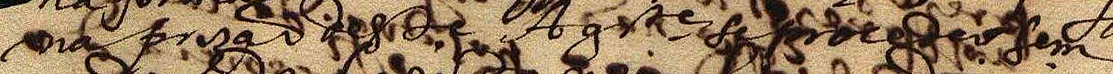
na prizaõ deste Agrte se procedeo sem
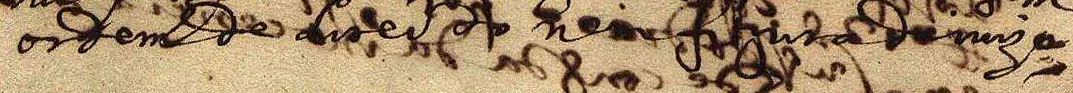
ordem de direito nem figura de iuizo
